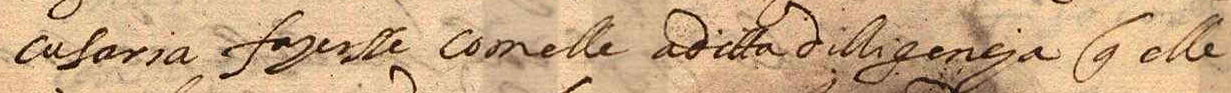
cusaria fazersse com elle a ditta dilligencia q̄ elle
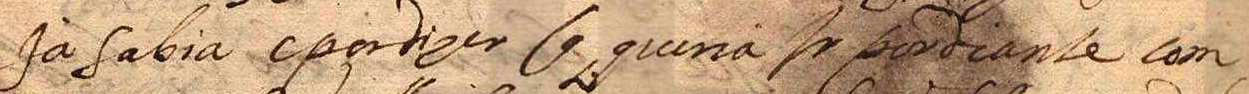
Ja sabia e por dizer q̄ queria Jr por diante com
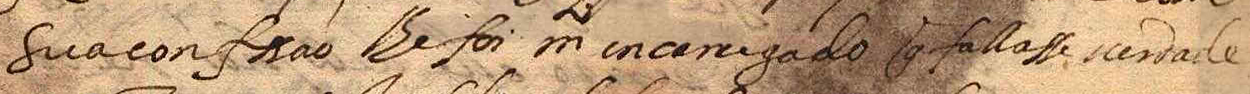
sua confissaõ lhe foi mto encarregado q̄ falasse uerdade
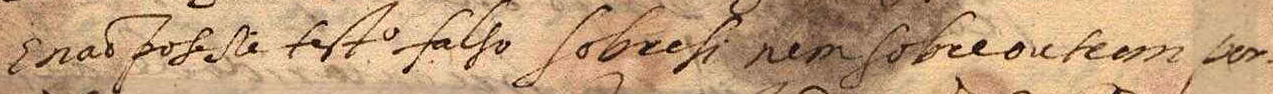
E não posesse testo falso sobre si nem sobre outrem por
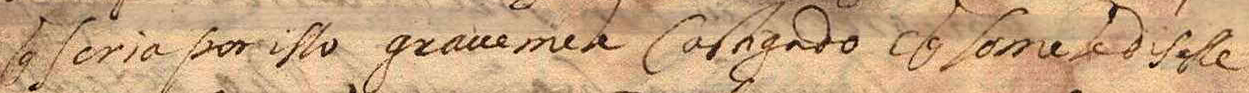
q̄ seria por isso grauemēte Castigado E q̄ somete disesse
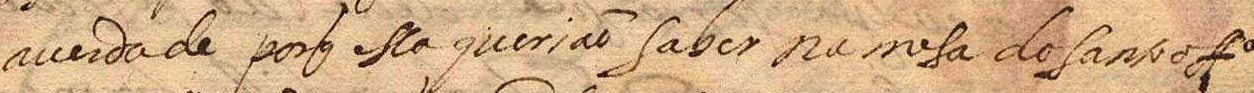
a uerdade porq̄ essa queriaõ saber na mesa do santo offo
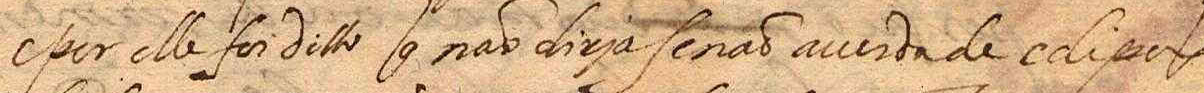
e per elle foi ditto q̄ naõ diria senaõ a uerdade e dipois
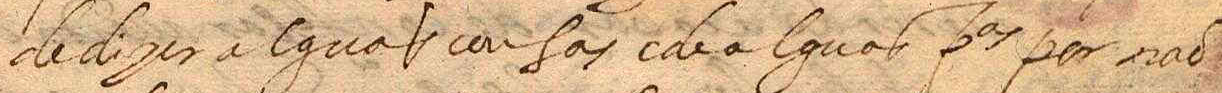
de dizer alguas cousas e de alguas pas por naõ
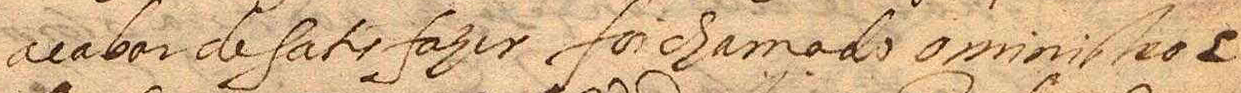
acabar de satisfazer foi chamado o ministro E
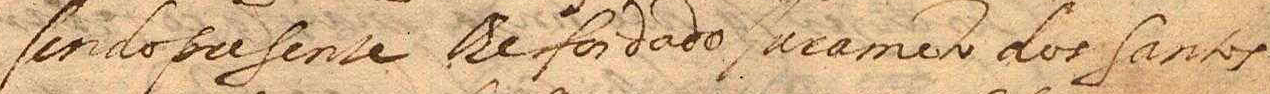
Sendo presente lhe foi dado Juramēto dos Santos
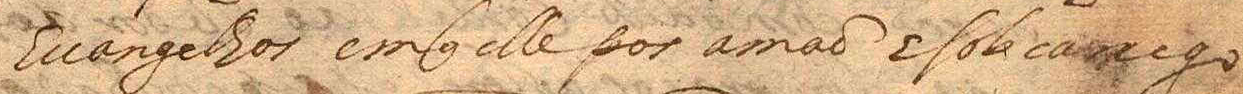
Euangelhos em q̄ elle pos a maõ E sob carrego
